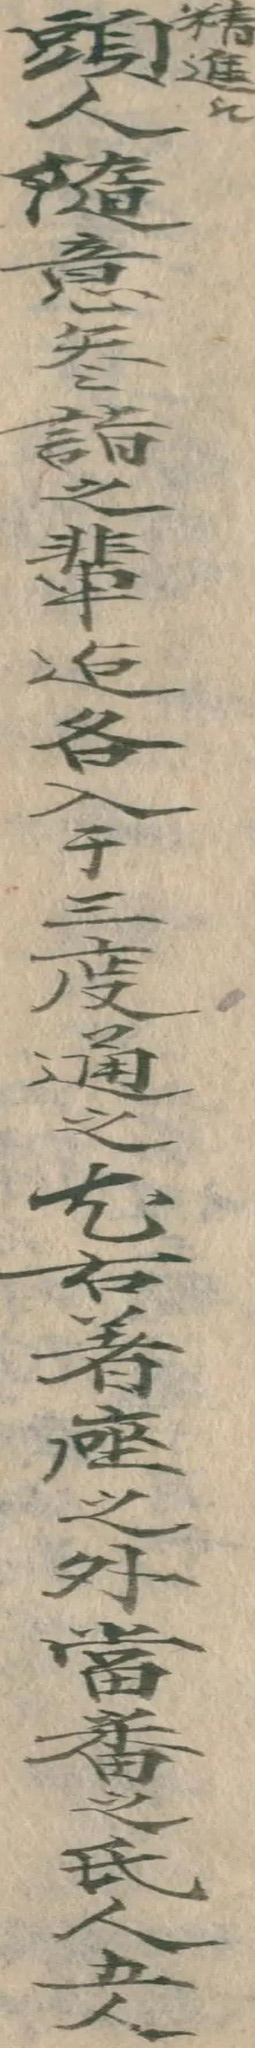頭人随意参詣之輩迄各入于三度通之尤右着座之外当番之氏人五人
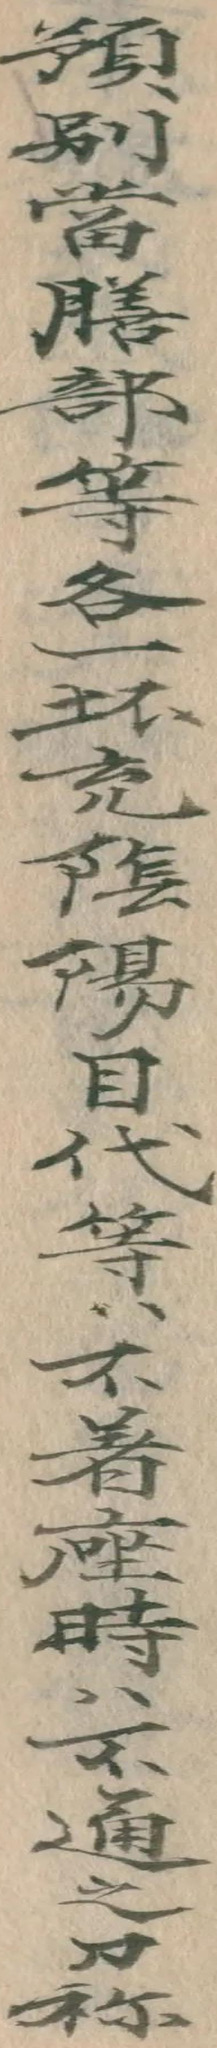預別当膳部等各一坏充陰陽目代等ハ不着座時ハ不通之刀祢
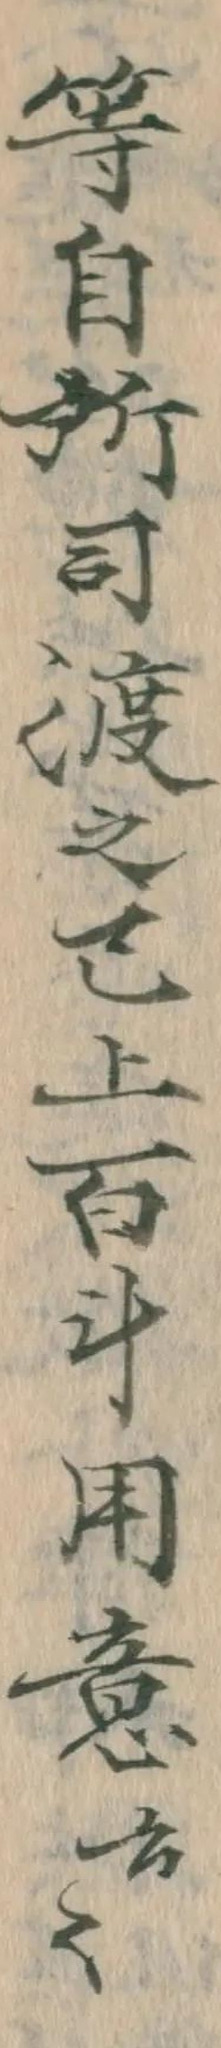等自所司渡之已上百計用意云々
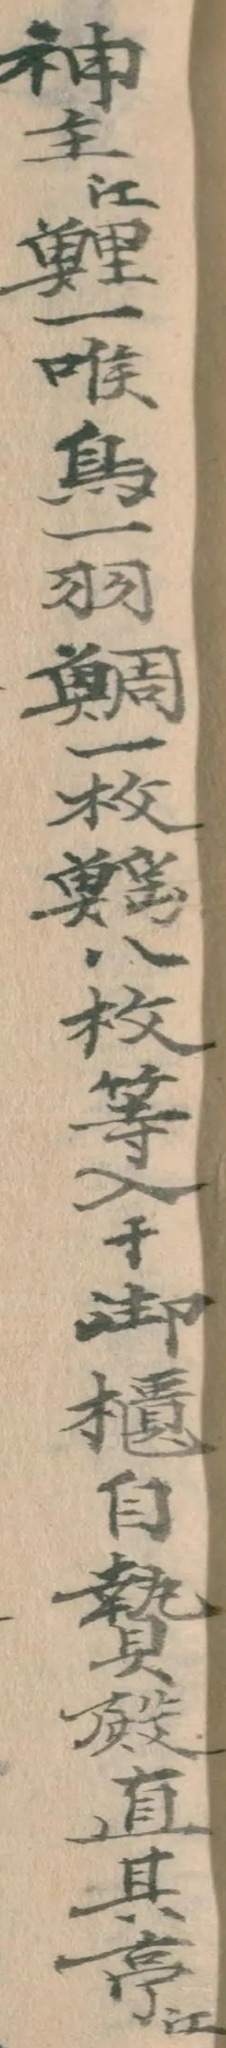神主江鯉一喉鳥一羽鯛一枚鰩八枚等入于御櫃自贄殿直其其亭江
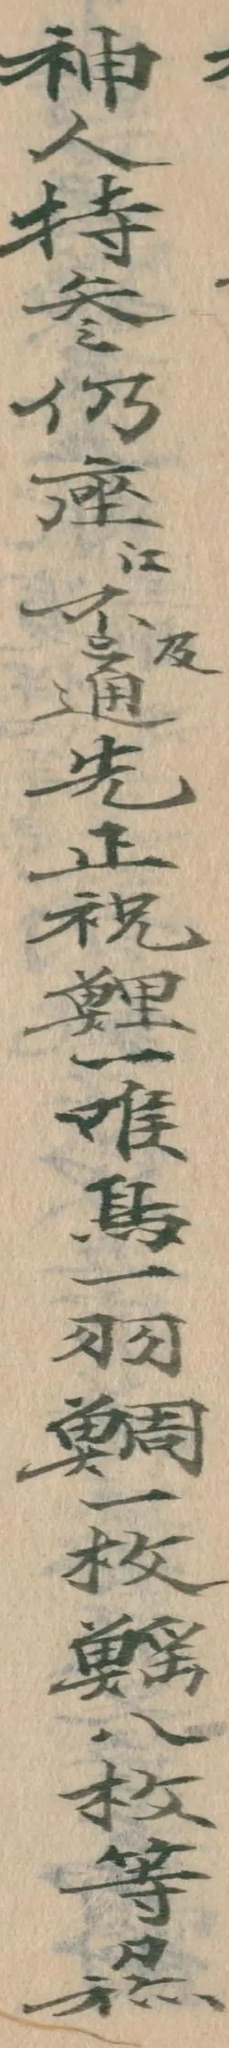神人持参仍座江不◦通先正祝鯉一喉鳥一羽鯛一枚鰩八枚等刀祢
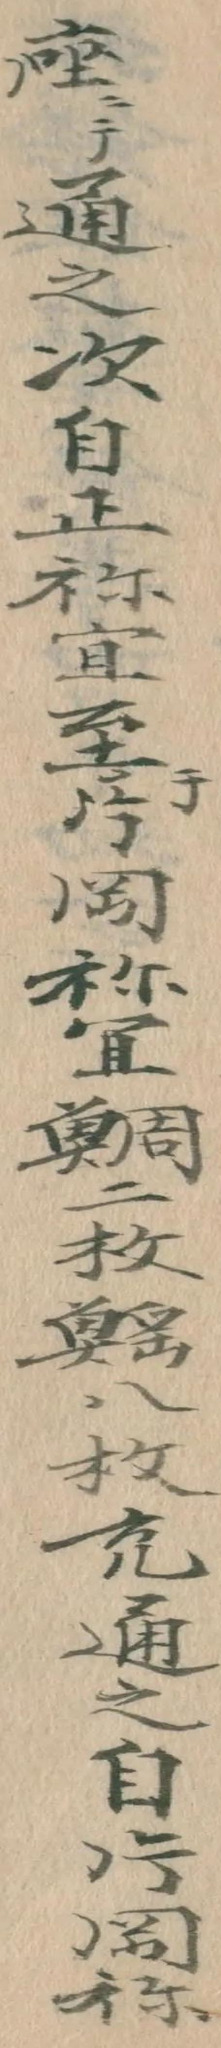座ニテ通之次自正祢宜至◦片岡祢宜鯛二枚鰩八枚充通之自片岡祢
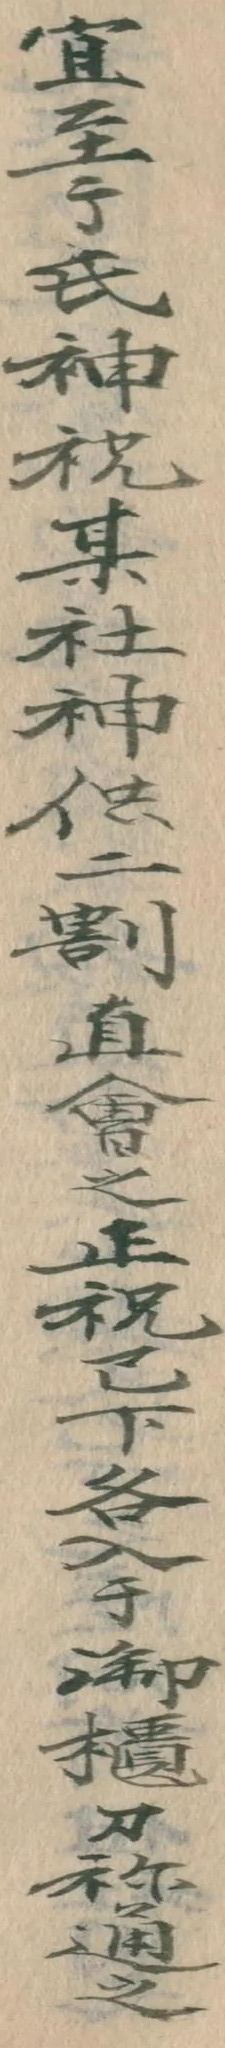宜至于氏神祝某社神供二割直会之正祝已下各入于御櫃刀祢通之
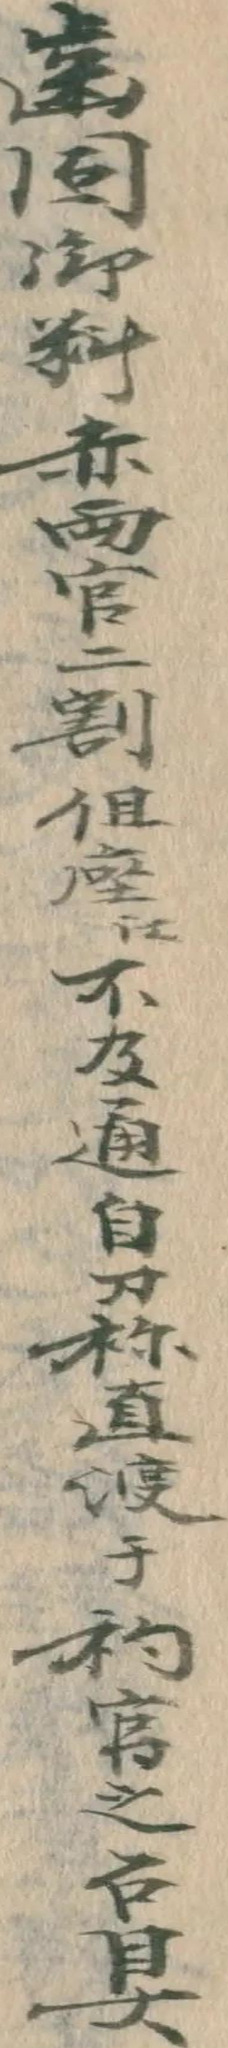歯固御料赤両官二割但座江不及通自刀祢直渡于祠官之召具
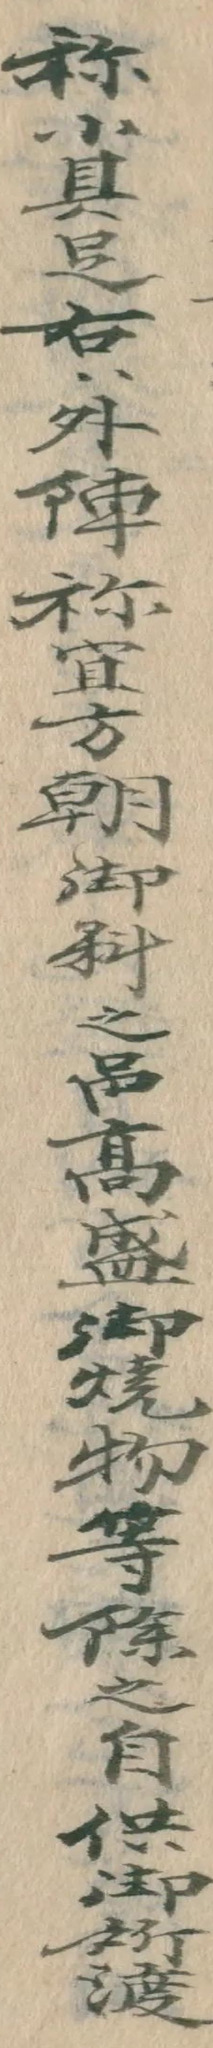祢小具足右ハ外陣祢宜方朝御料之品高盛御焼物等除之自供御所渡
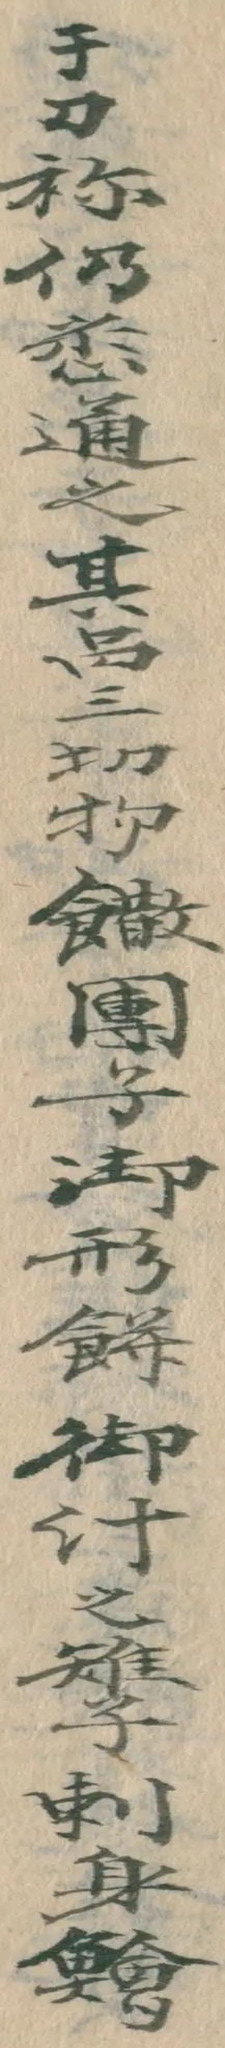于刀祢仍悉通之其品三切物饊団子御形餅御汁之雉子刺身鱠
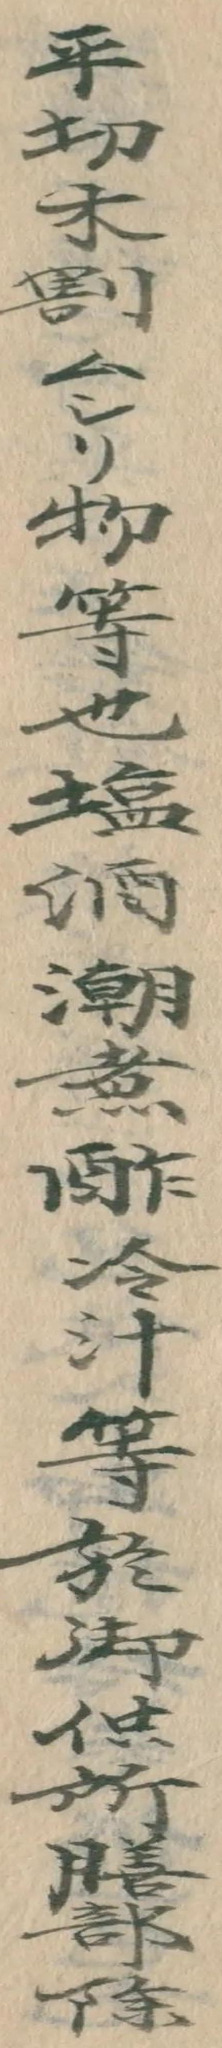平切木割ムシリ物等也塩酒潮煮酢冷汁等於御供所膳部除
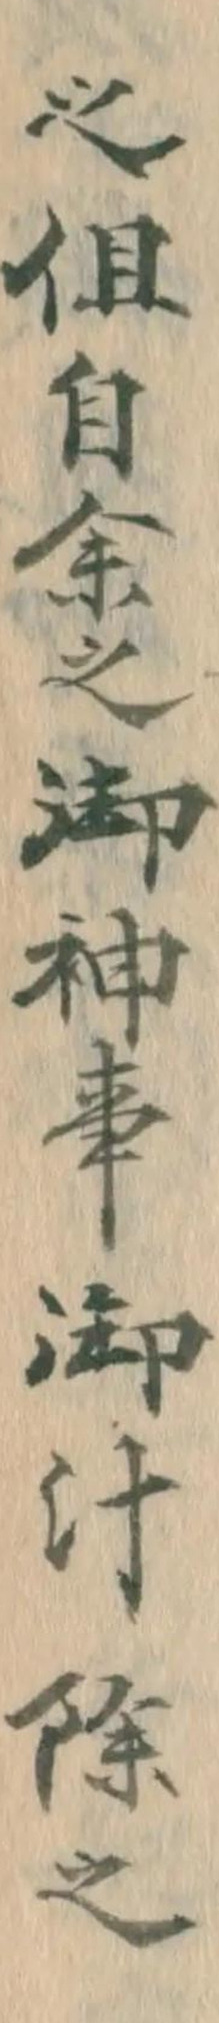之但自余之御神事御汁除之

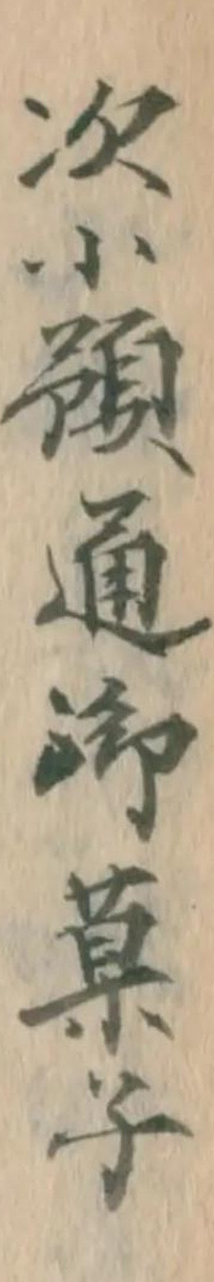次小預通御菓子
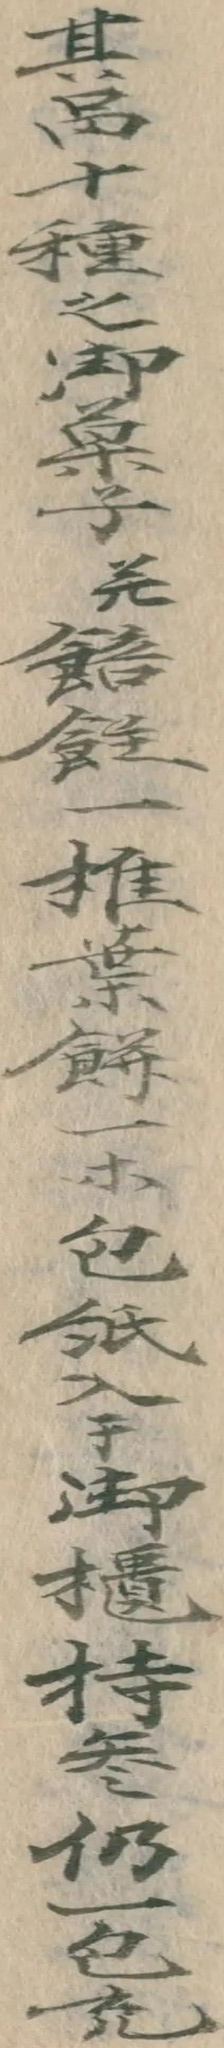其品十種之御菓子并餢飳一椎葉餅一等包紙入于御櫃持参仍一包充
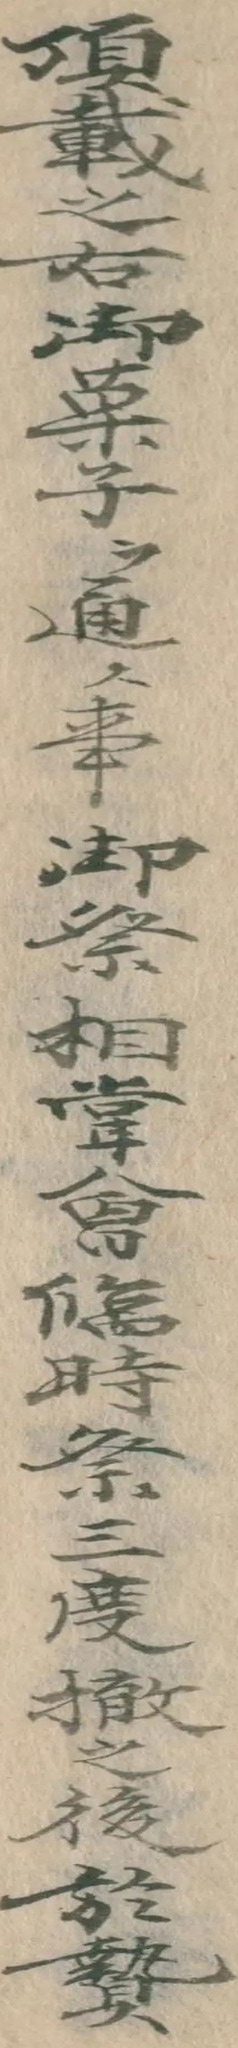頂戴之右御菓子ヲ通ス事御祭相甞会臨時祭三度撤之後於贄
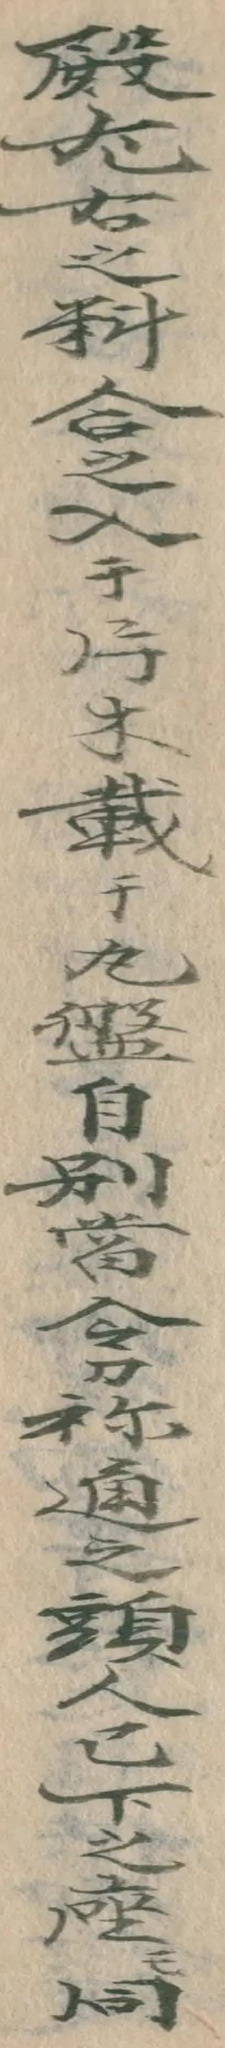殿左右之料合之入于片木載于丸盤自別当令刀祢通之頭人已下之座モ同
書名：賀茂社記録. 第9冊
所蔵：国立国会図書館 National Diet Library, JAPAN
